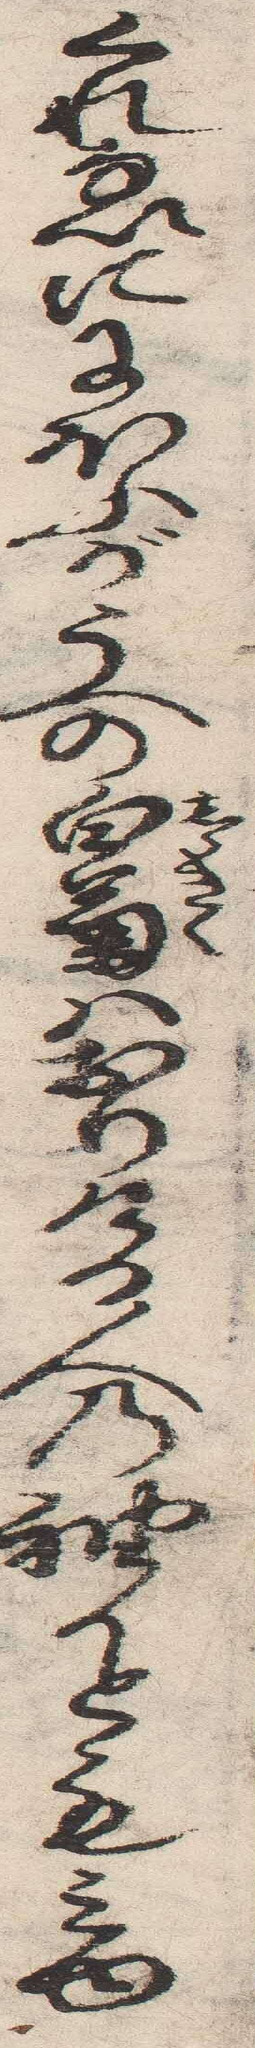くれないににほふがうへの白菊はおりける人の袖かともみゆ
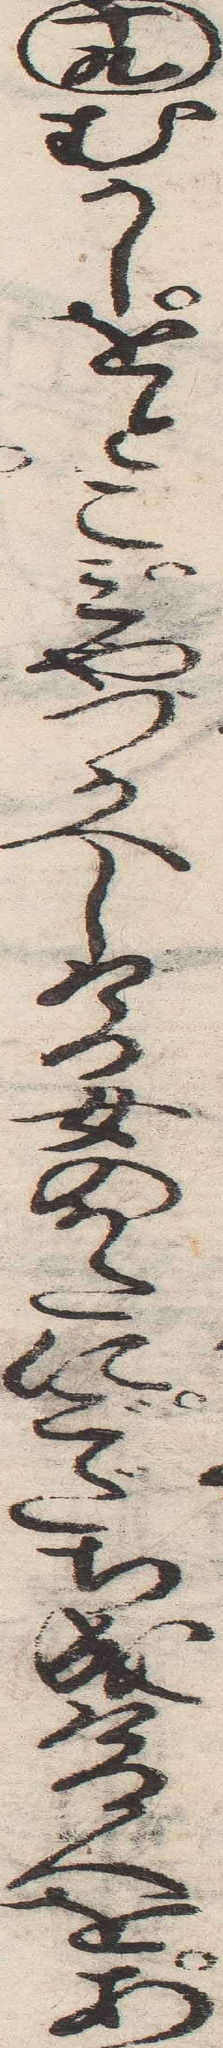十九むかし。をとこ。みやづかへしける女のかたに。ごだち成ける人を。あ
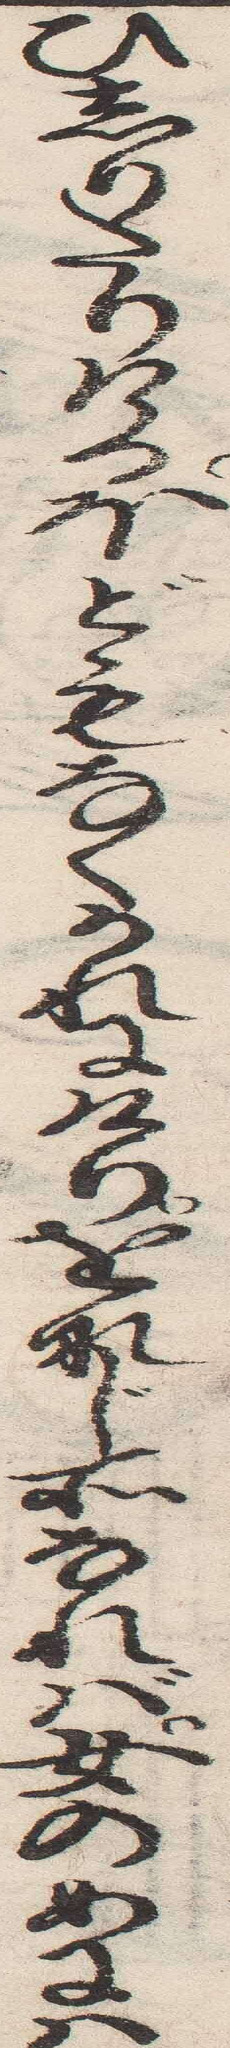ひしりたりける。ほどもなくかれにけり。をなじ所なれば。女のめには
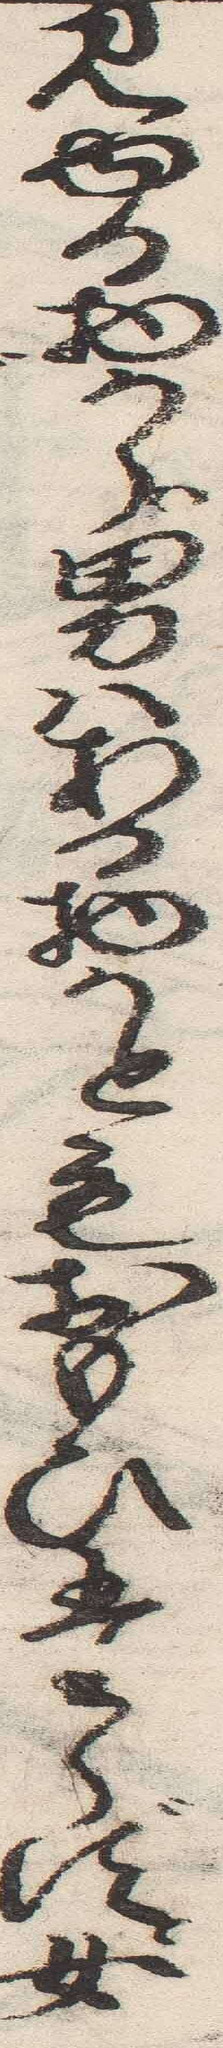見ゆる物から。男はある物かともおもひたらず。女
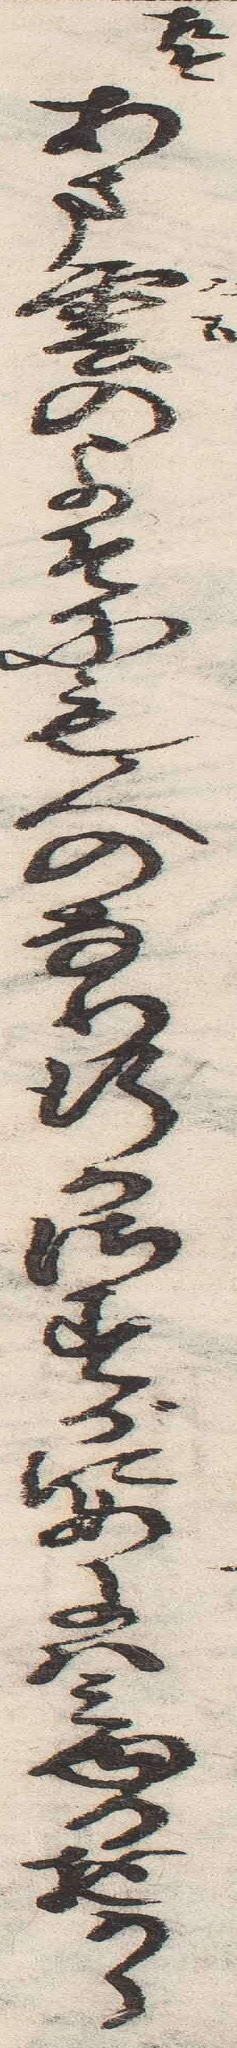古今あま雲のよそにも人のなり行かさすがにめにはみゆる物から
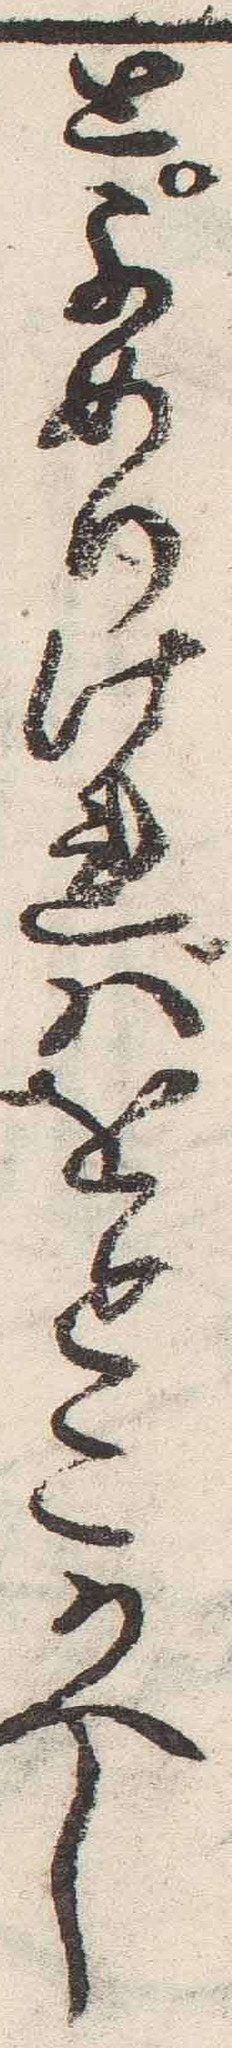と。よめりければをとこかへし
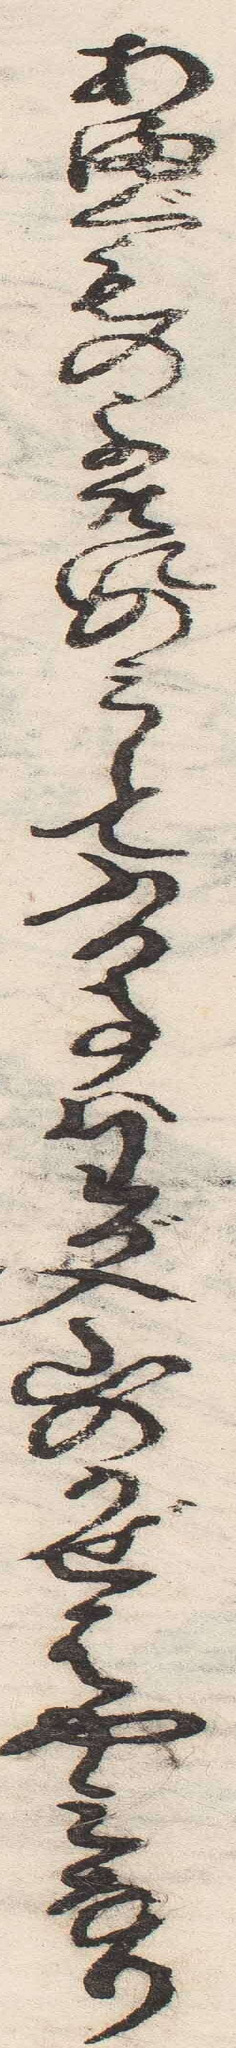同あまぐものよそにのみしてふる事はわが入山のかぜはやみなり
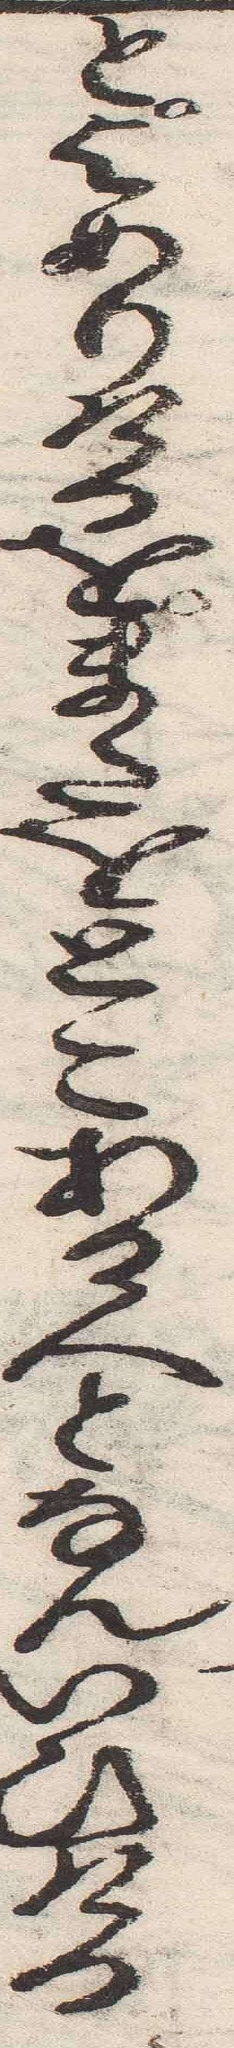と。よめりけるを。またをとこある人となんいひける
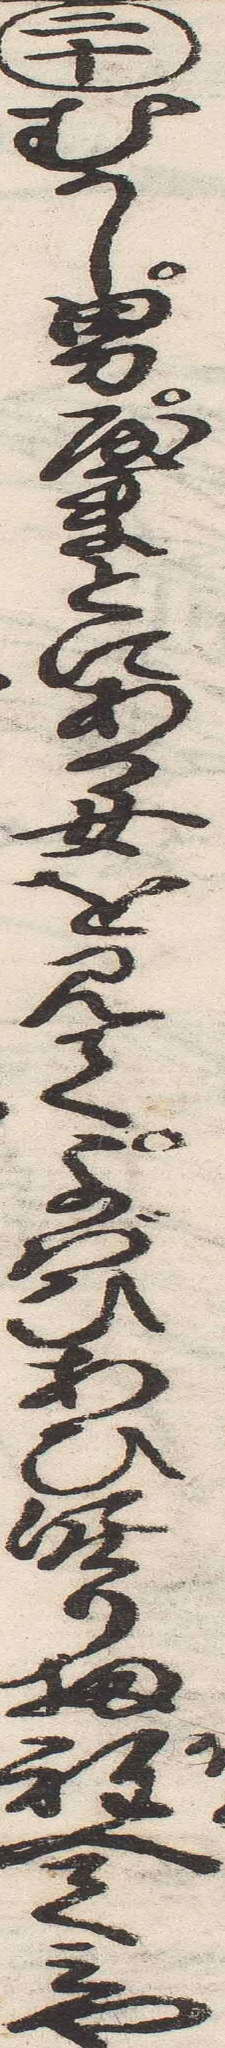二十むかし。男。やまとにある女を見て。よばひあひにけり扨程へてみや
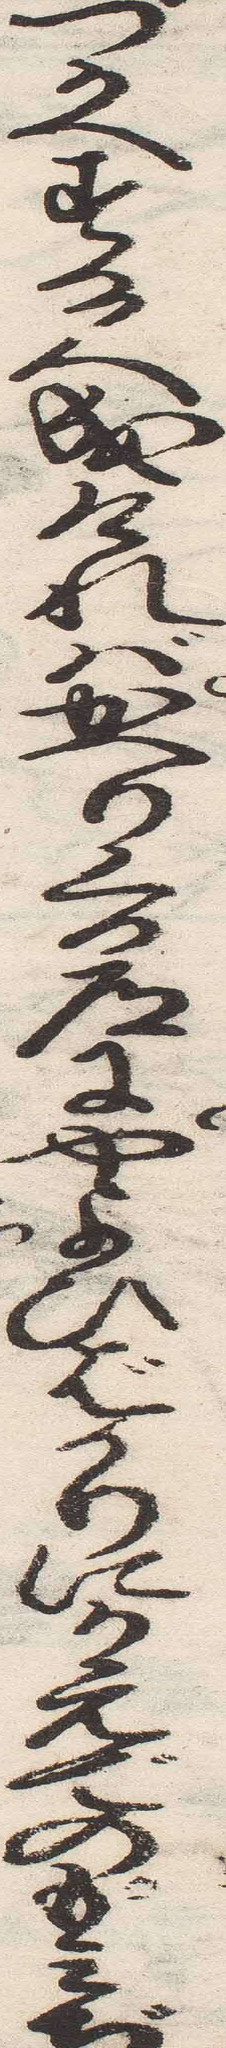づかへする人成ければ。かへりくる道に。やよひばかりにかえでの。もみぢ
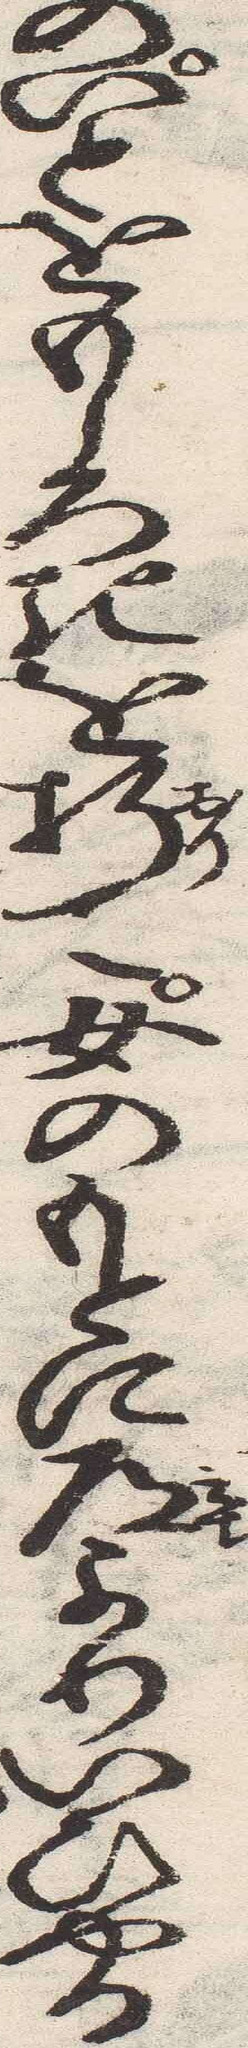の。いとをもしろきを折て。女のもとに道よりいひやる
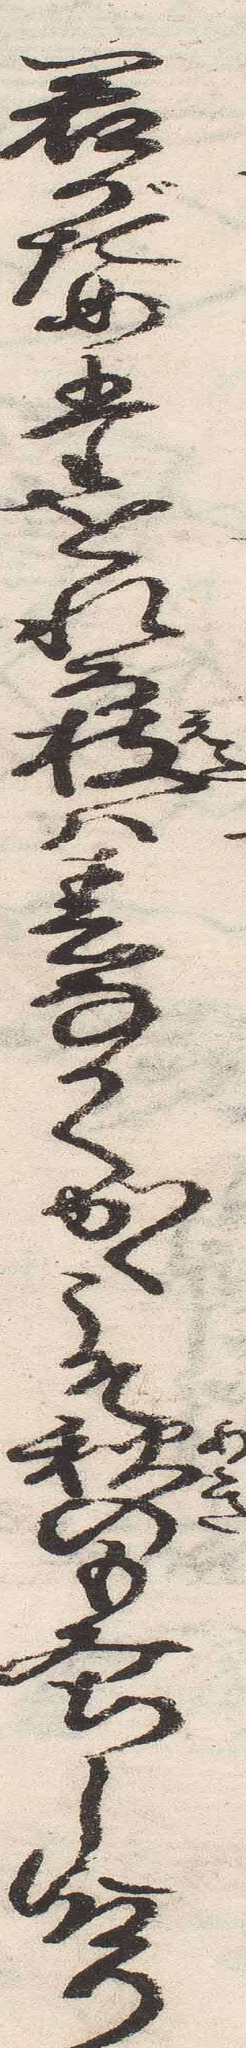君がためたをれる枝は春なかくかくこそ秋のもみちしにけり
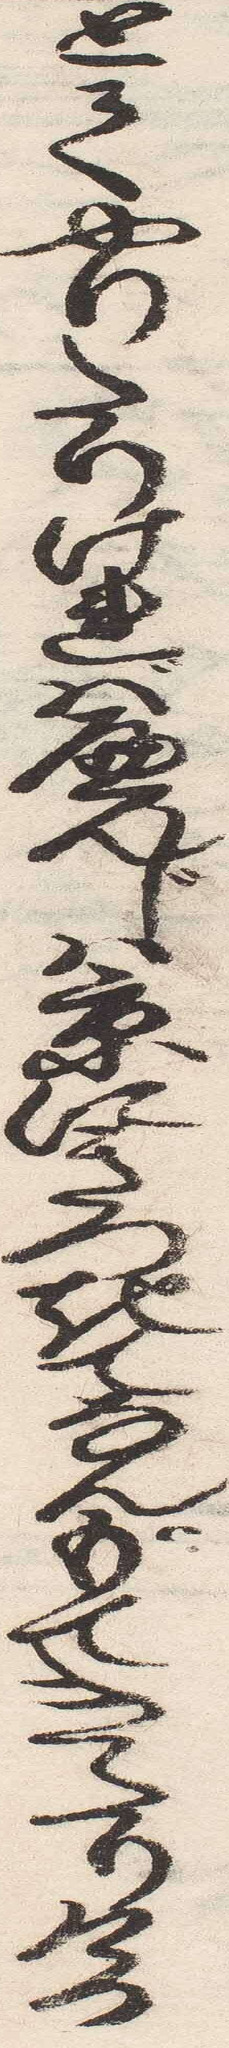とてやりたりければへんじは京にきつきてなん。もてきたりける
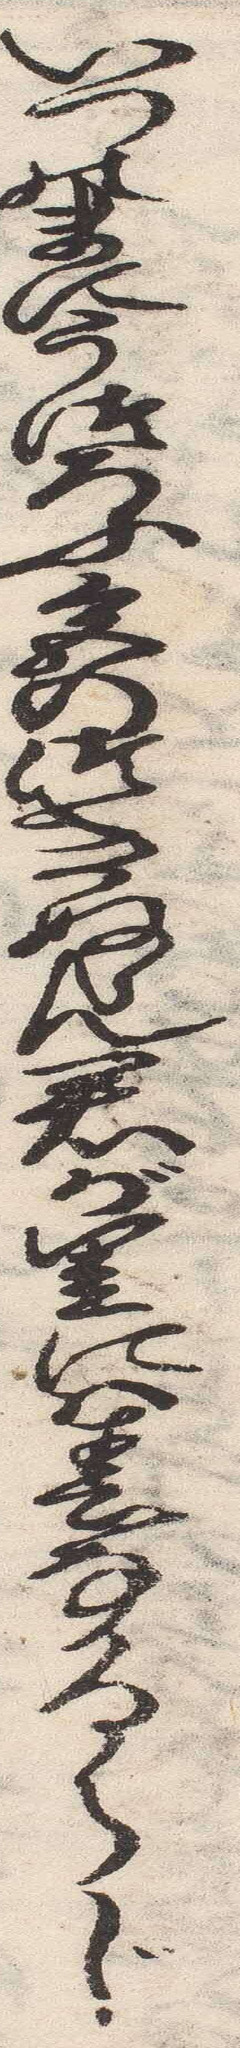いつのまにうつろふ色のつきぬらん君が里には春なかるらじ
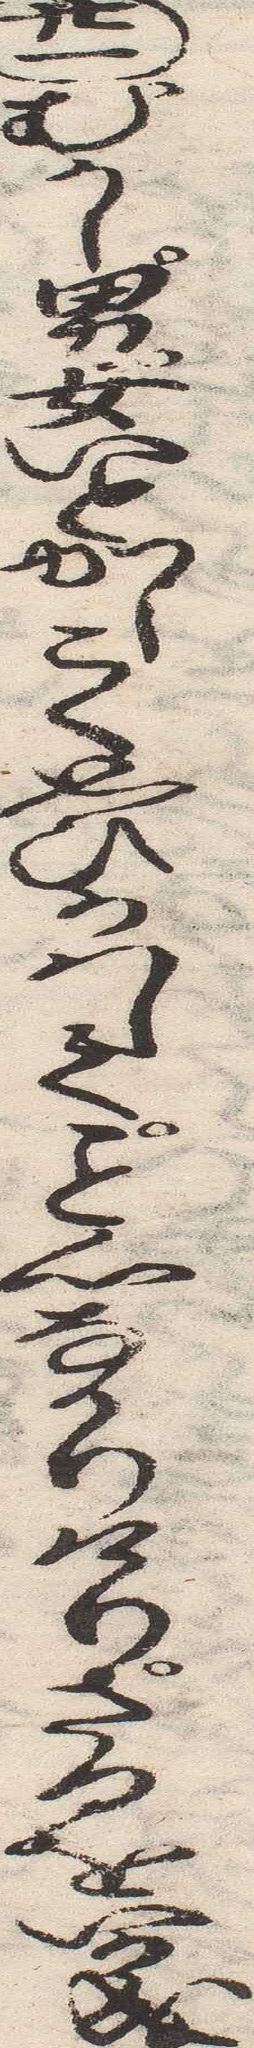廿一むかし。男。女いとかしこく思ひかはして。こと心なかりけり。さるをいか成
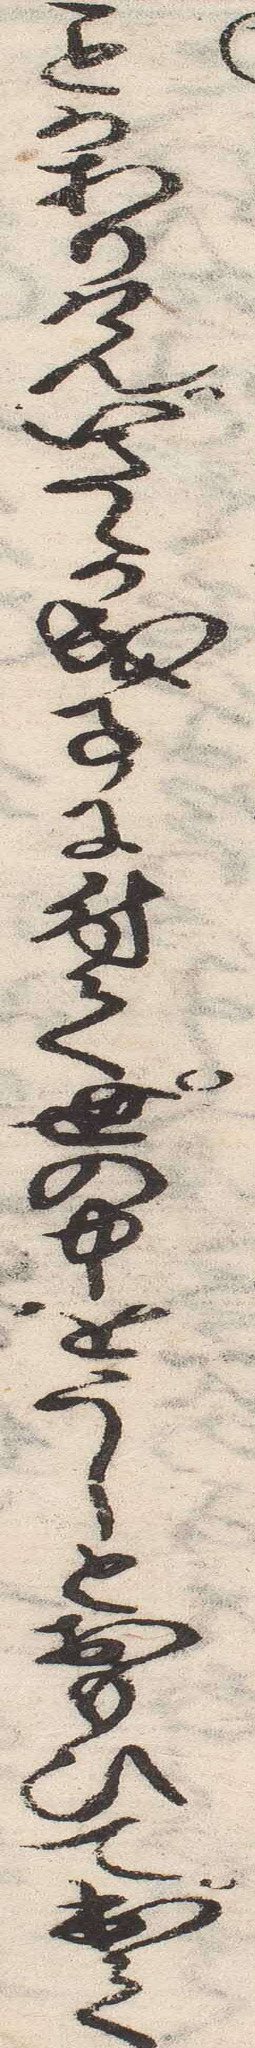ことかありけん。いさゝか成事に付て。世の中をうしとおもひて。出て
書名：伊勢物語
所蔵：東京学芸大学附属図書館 国文学研究資料館
